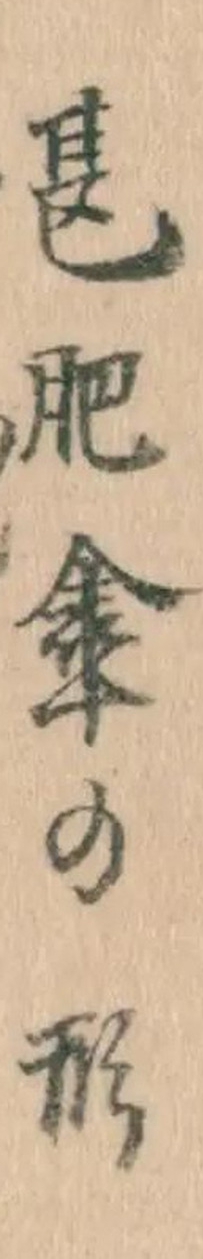甚肥傘の形
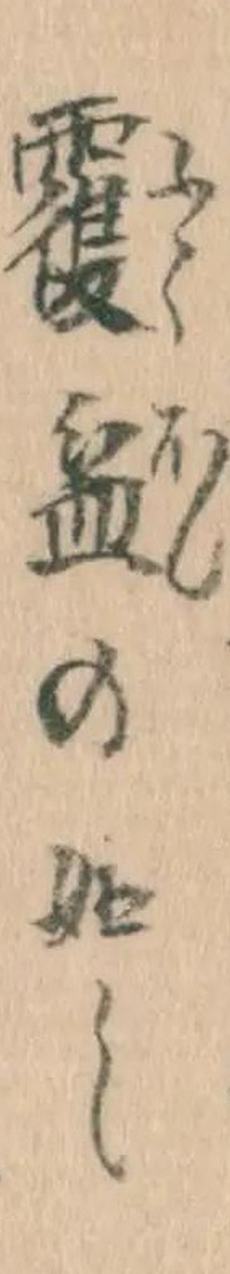覆盆の如し
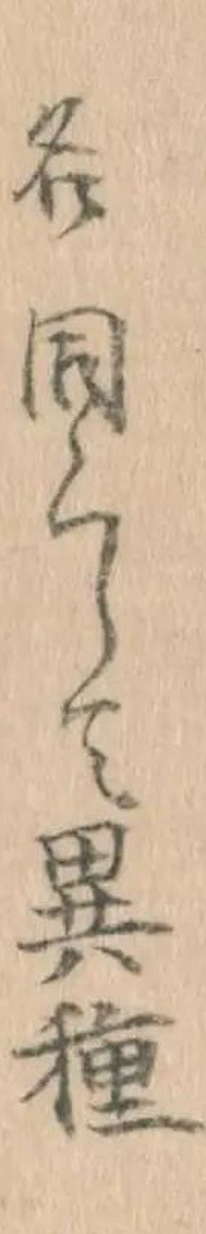名同くして異種
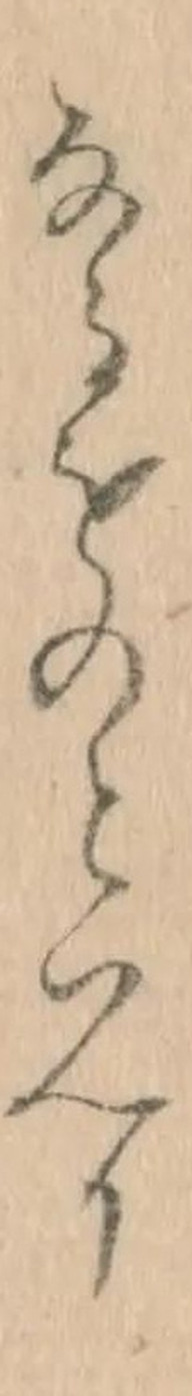なるものといへり

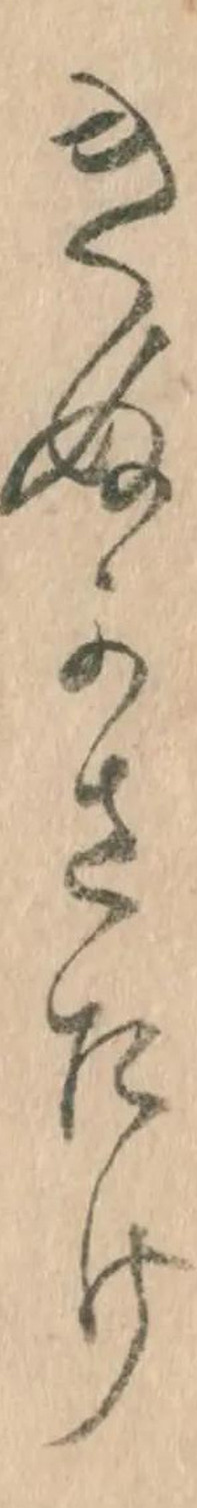きぬかさたけ
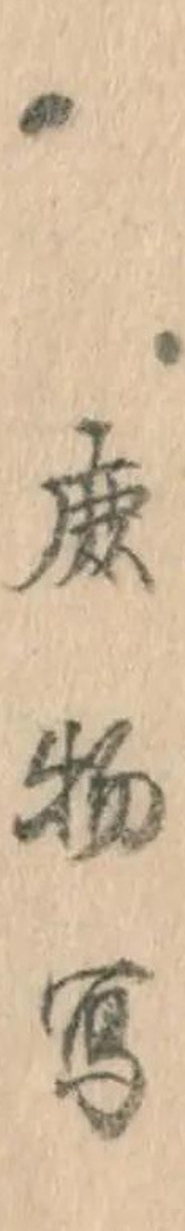庶物写
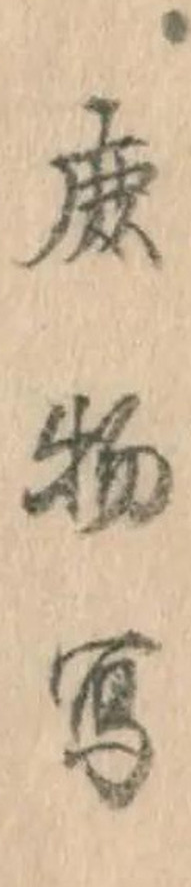庶物写
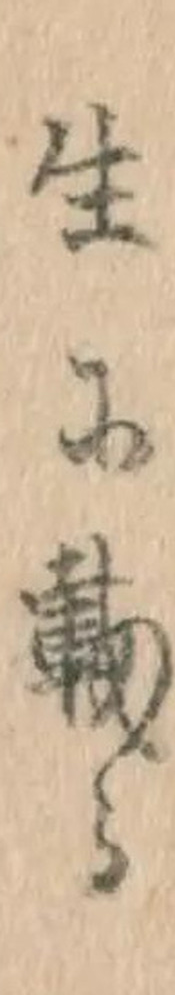生に載る
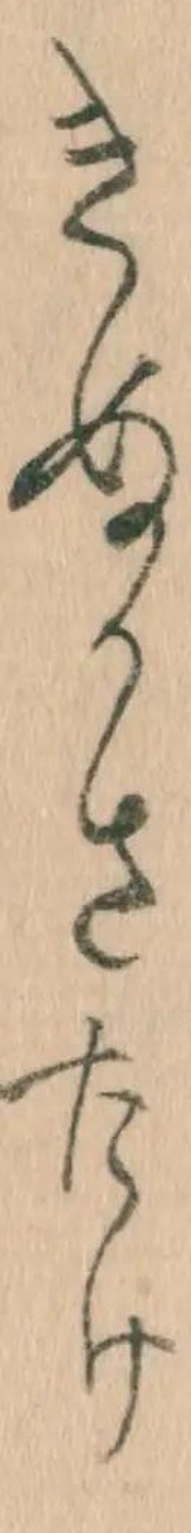きぬかさたけ
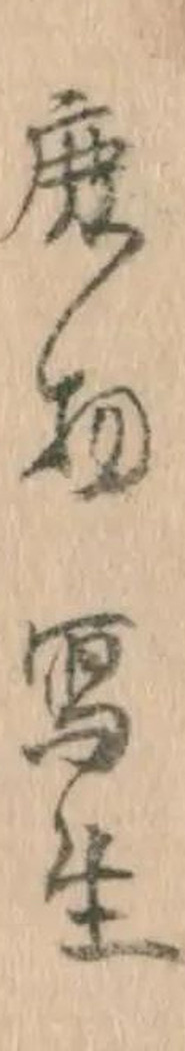庶物写生
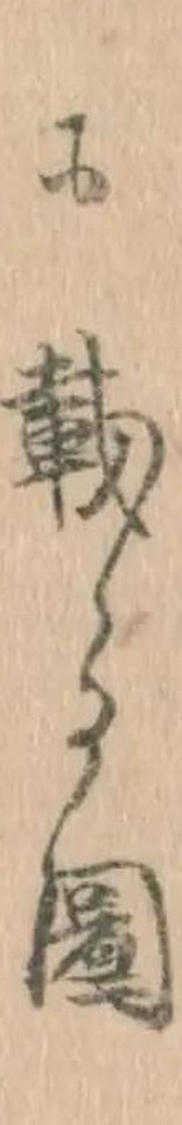に載る図

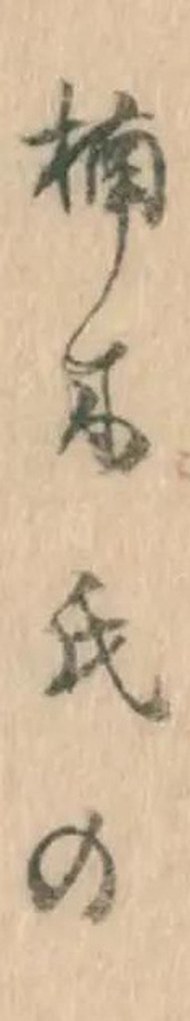楠木氏の
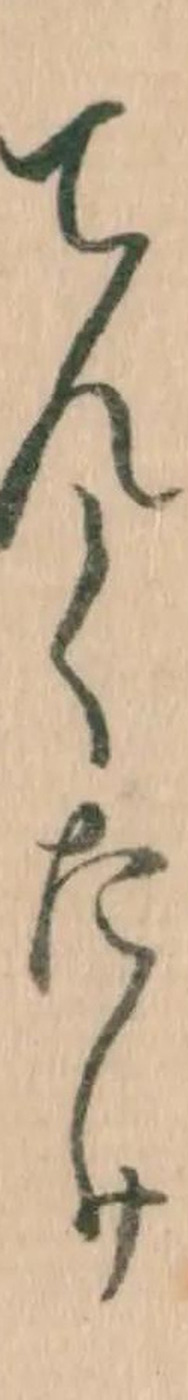てんくたけ
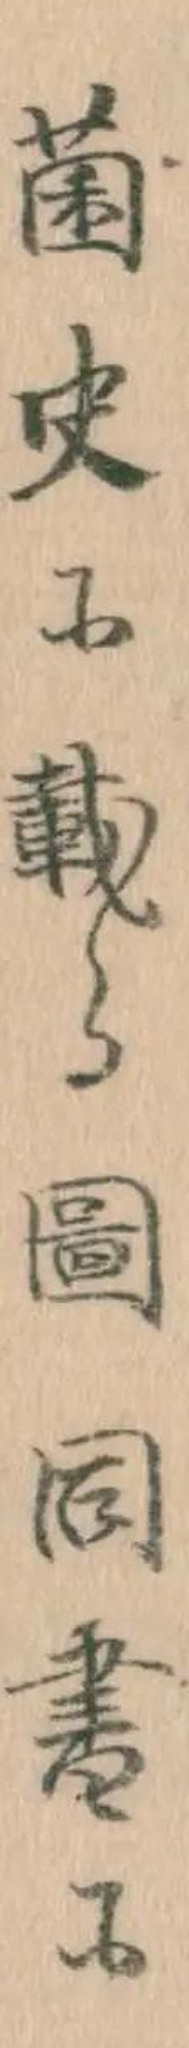菌史に載る図同書に
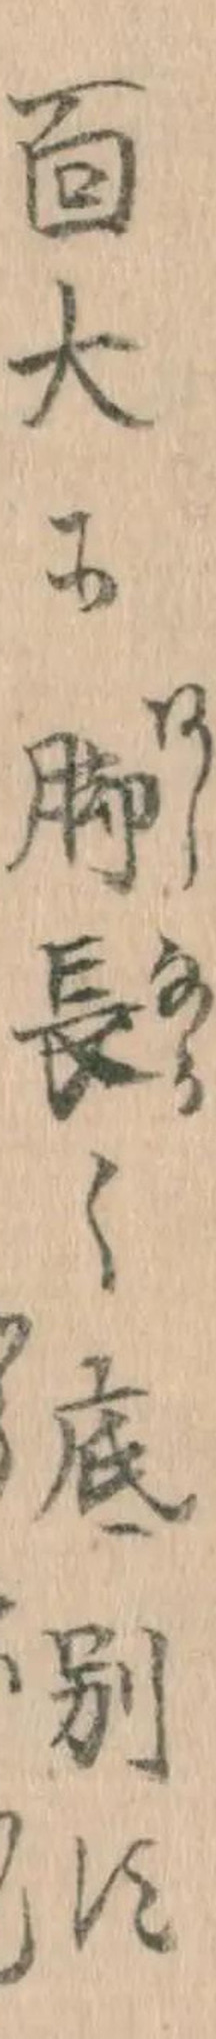面大に脚長く底別す
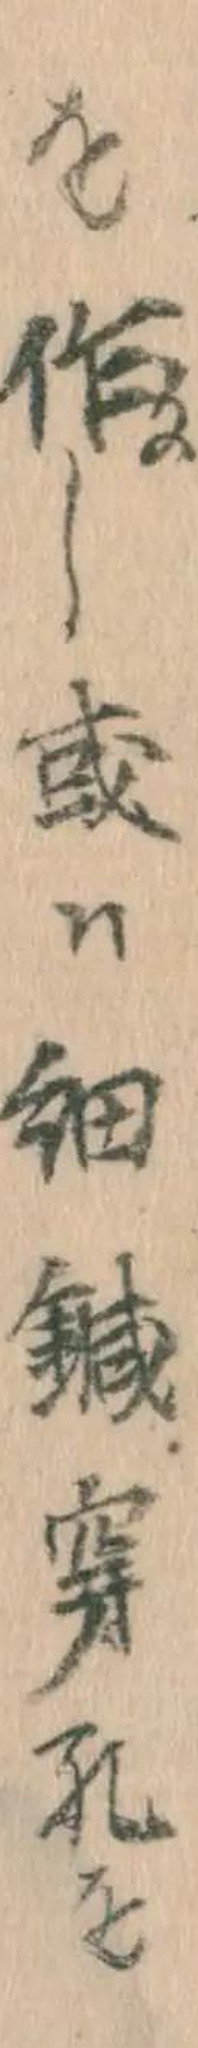を作し或は細鍼穿孔を
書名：本草図譜. 巻58-60
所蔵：国立国会図書館 National Diet Library, JAPAN
